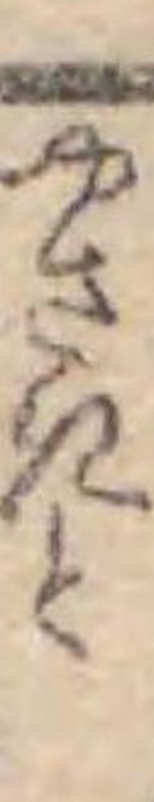やさきと
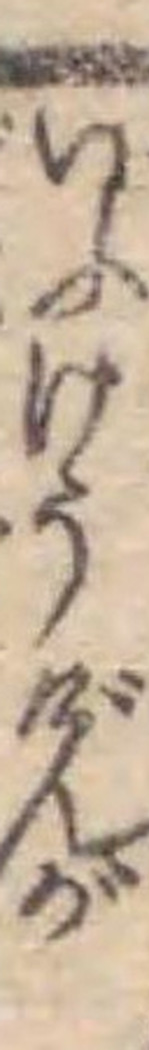いふけうげんが
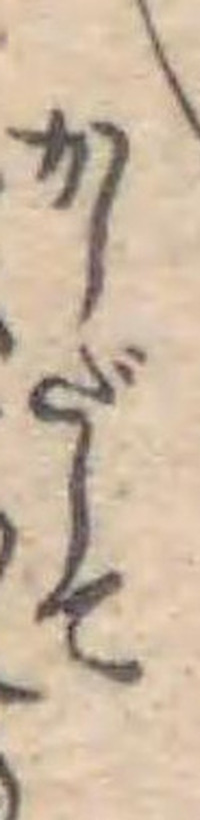かしだして
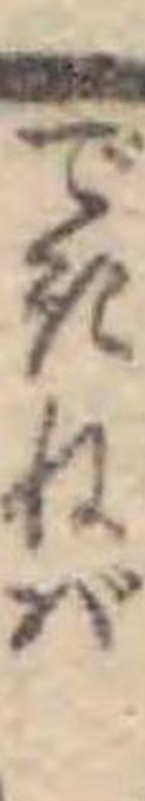できねば
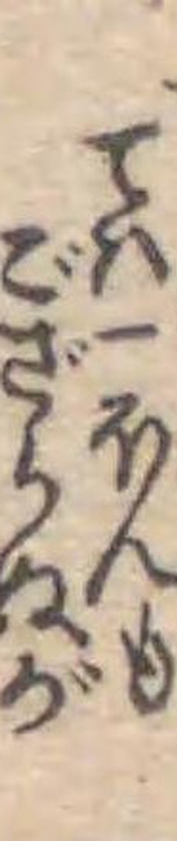ござらぬが
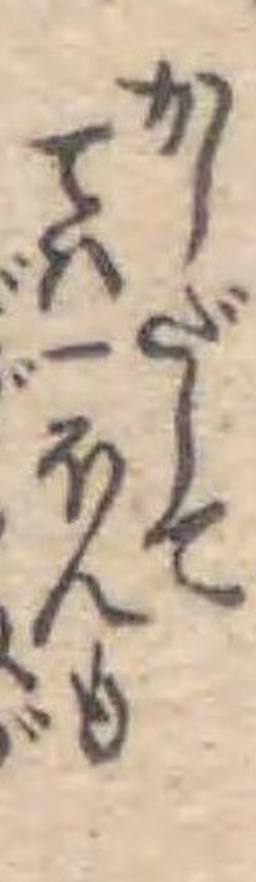ては一ほんも
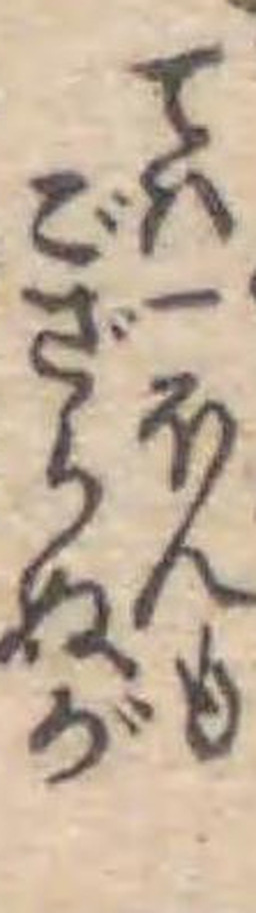ござらぬが
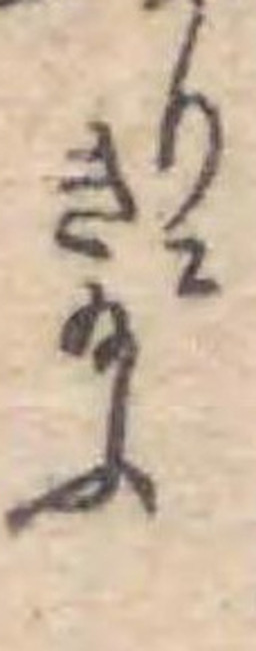き給ふ
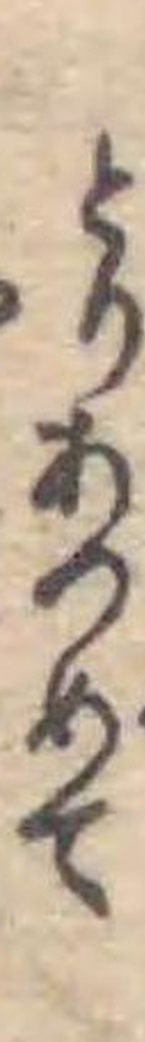とりあつめて
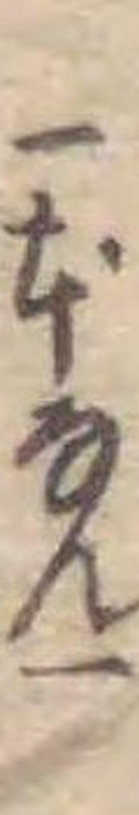一本なん一
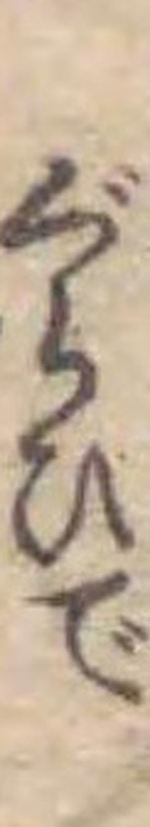ぐらひで
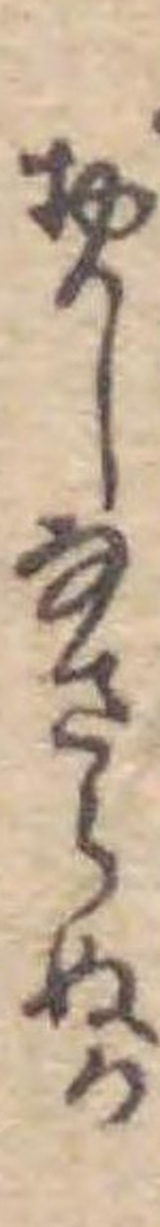おかしなさらぬか
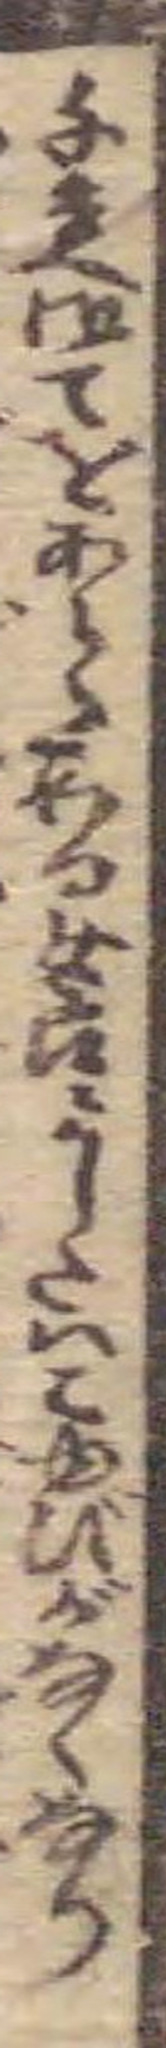千兵へ御てをあたらためる女郎にかしたはこゆびがなくなり
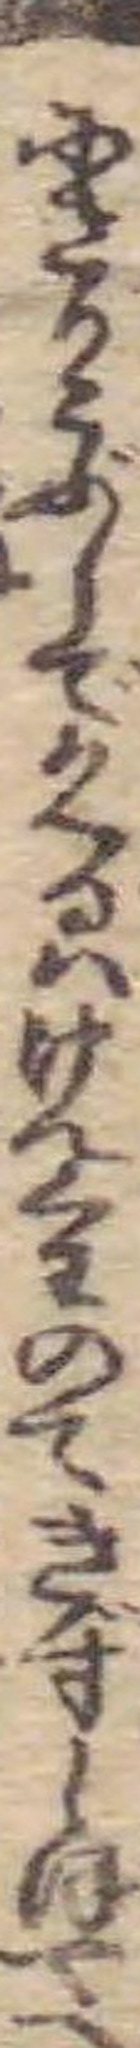にきりこぶしでかへるはけんくわのてきずしほやへ
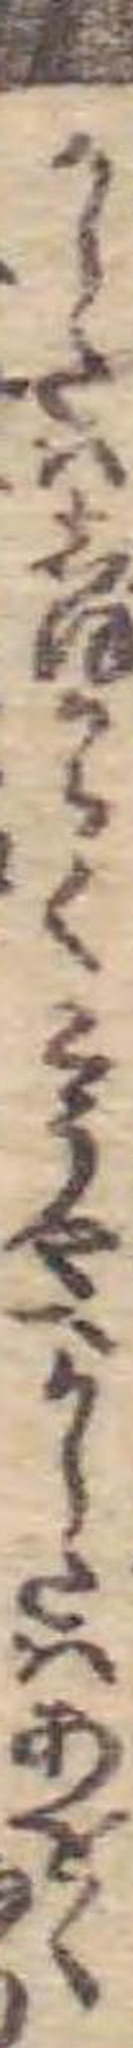かしたはしほらしくこうやへかしたはあをくなり
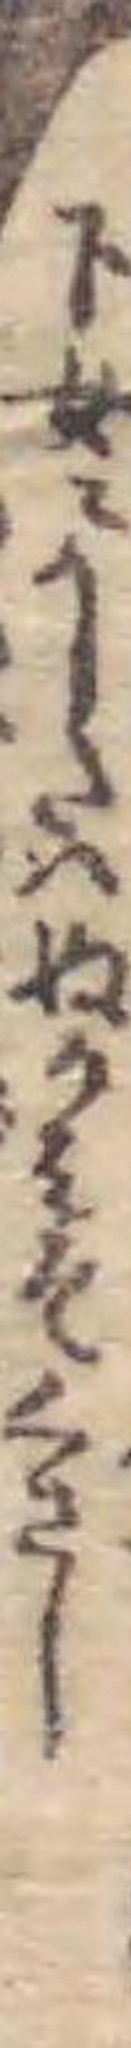下女にかしたはぬかみそくさし
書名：大悲の千六本 : 1巻
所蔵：国立国会図書館 National Diet Library, JAPAN
